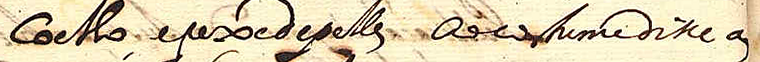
Coelho, e pexe de pelle ao costume disse a
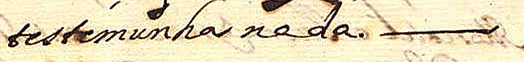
testemunha nada. ———
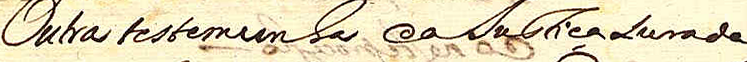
Outra testemunha da Iustiça iurada
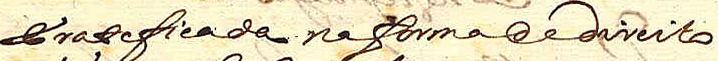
& rateficada na forma de direito
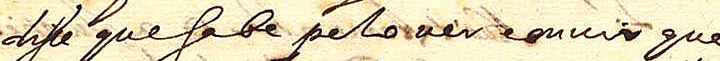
disse que sabe pelo uer e ouuir que
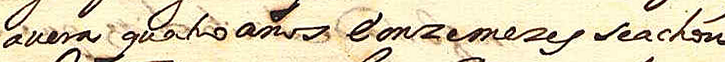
auera quatro anos & onze mezes se achou
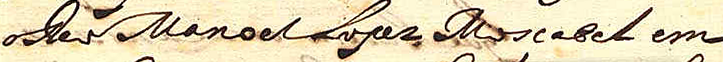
o Reo Manoel Lopez Moscatel em
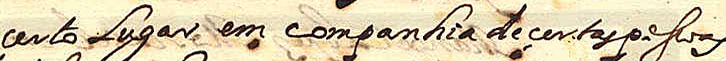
çerto Lugar em companhia de çertas pessoas
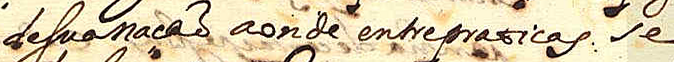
de sua naçaõ aonde entre praticas se
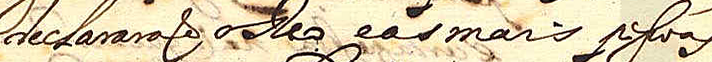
decLararaõ o Reo e as mais pessoas
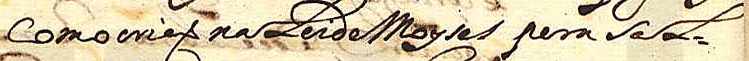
como criaõ na Lei de Moyses pera saL
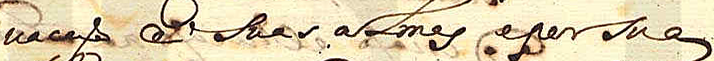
uaçaõ de Suas aLmas e por sua
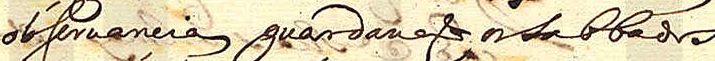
obseruancia guardauaõ os sabbados
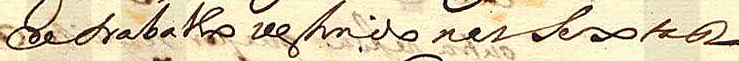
de trabalho uestindo nas Sextas
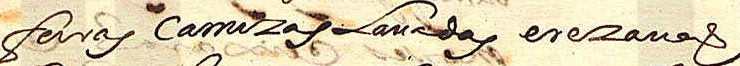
feitas camizas Lauadas e rezauaõ
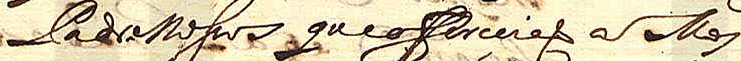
Padre Nossos que offereçiaõ a Moj
